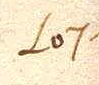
107.
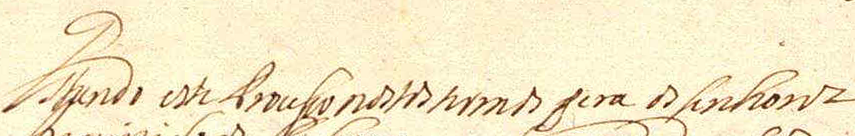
Estando este Processo nestes termos pera os senhorez
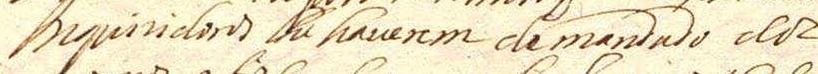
Inquizidores lhe hauerem de mandado doz
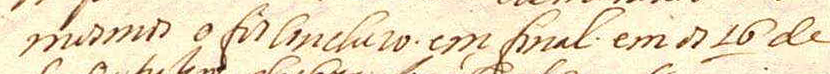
mesmos o fis concluzo em final em os 16 de
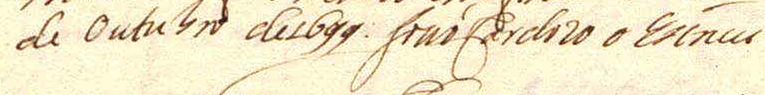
de Outubro de 1699. Joaõ Cardozo o Escreui
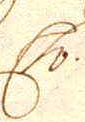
Clo.
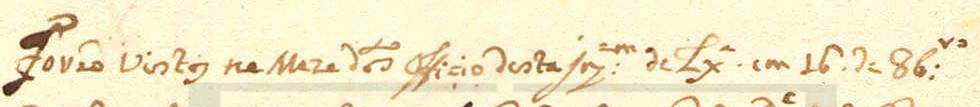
Forão vistos na Meza do sto officio desta jnq.am de Lx.a em 16 de 8b.ro
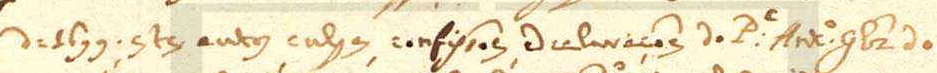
de 1699; estes autos, culpas, confissoẽs, Declarações do P.e Ant.o glz̄ do
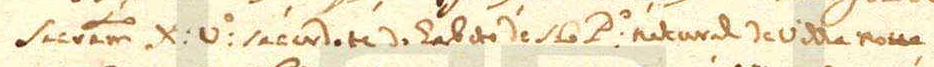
Sacramto x: v.o sacerdote do habito de são P.o natural de villa noua
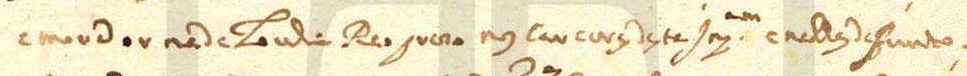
e morador na de Loule Reo prezo nos carceres desta jnq.am e nelles defunto,
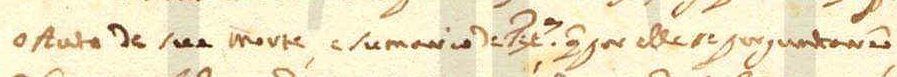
o Auto de sua morte e sumario de Testas; q̄ por elle se perguntaraõ
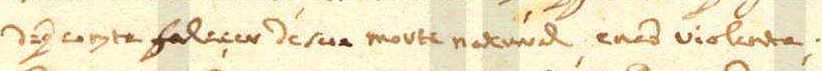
d q̄ consta falecer de sua morte natural e naõ violenta.
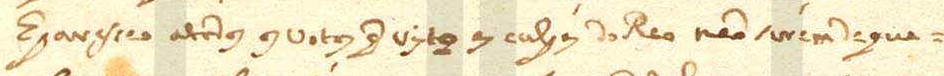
E paresseo a todos os votos q̄ visto as culpas do Reo não serem de qua
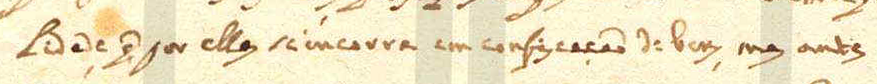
Lidade q̄ por ellas se incorra em confiscação de bens, mas antes
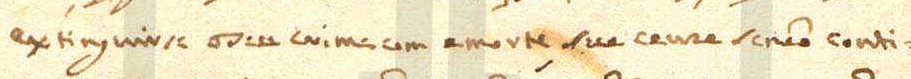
extinguirse o seu crime com a morte sua cauza se não conti
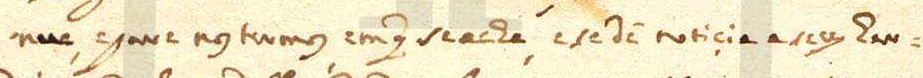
nue, e pare nos termos em q̄ se acha e se dé noticia e seus her
